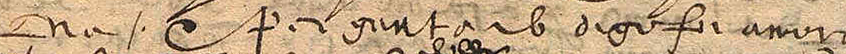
Dia /. e perguntado digo foi amoes
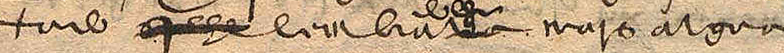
tado selhe lembradolhe majs alguā
